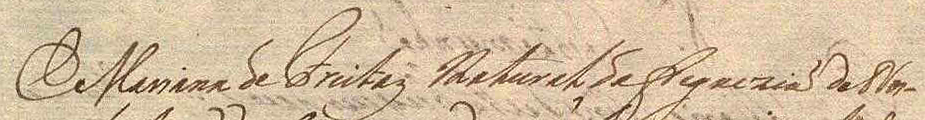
E Mariana de Freitaz Natural da freguezia de Nos
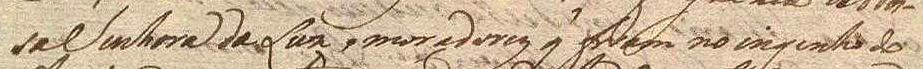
sa Senhora da Luz, moradores q̄ foram no ingenho do
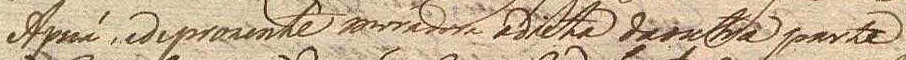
Apuá, e de prezente moradora a dicta da outra parte
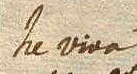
he viva
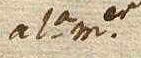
a 1.a m.er
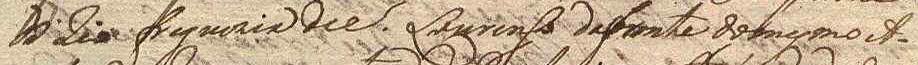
Do Rio freguezia de S. Lourenso da fronte do mesmo A
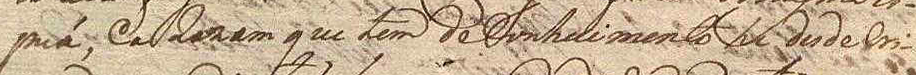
puá, e a Razam que tem de Conhecimento he desde Cri
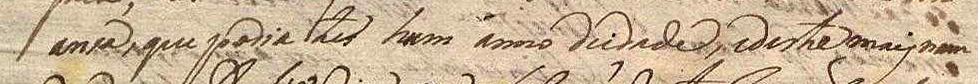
ansa, que podia ter hum anno de idade, e deste mais nam
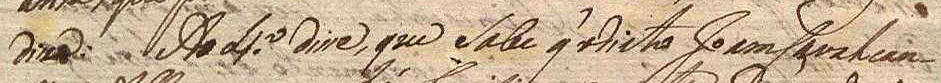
dise. Ao 4.o disse, que Sabe q̄ o dicto Joam Cavalcan
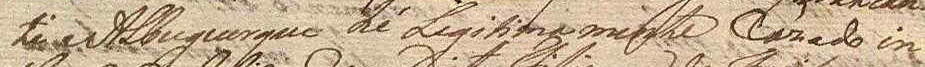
ti e Albuquerque hé Legitimamente Cazado in
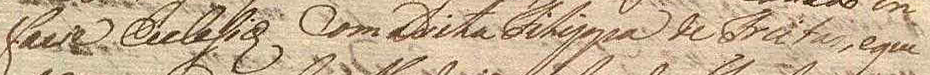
facie Ecclesiæ Com a dita Filippa de Freitas, e que
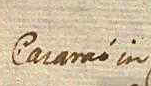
Cazaraõ in
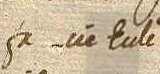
fa-cie Eccle
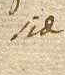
siæ
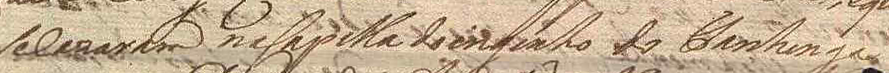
se cazaram na Capella do engenho do Tanhenga
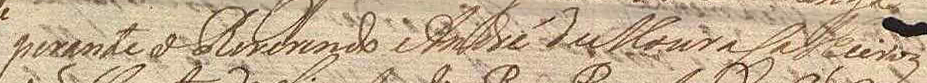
perante o Reverendo André de Moura Calheiroz
